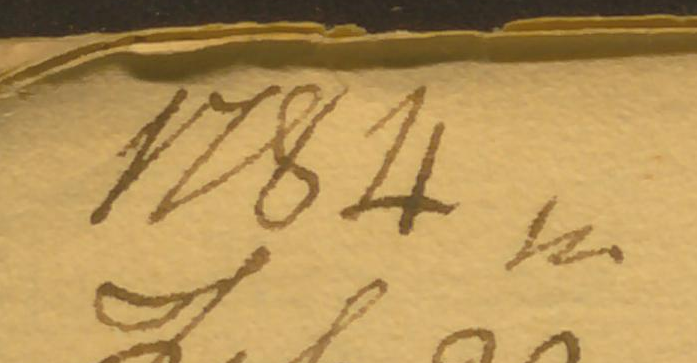1784
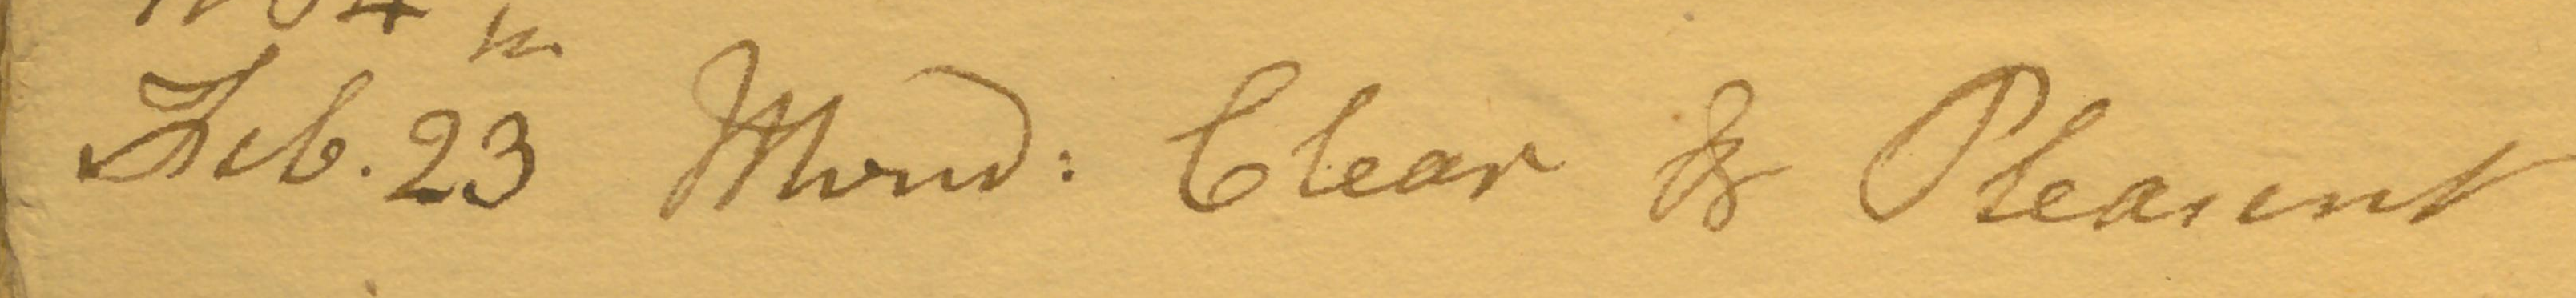Feb. 23^th Mond: Clear & Pleasent
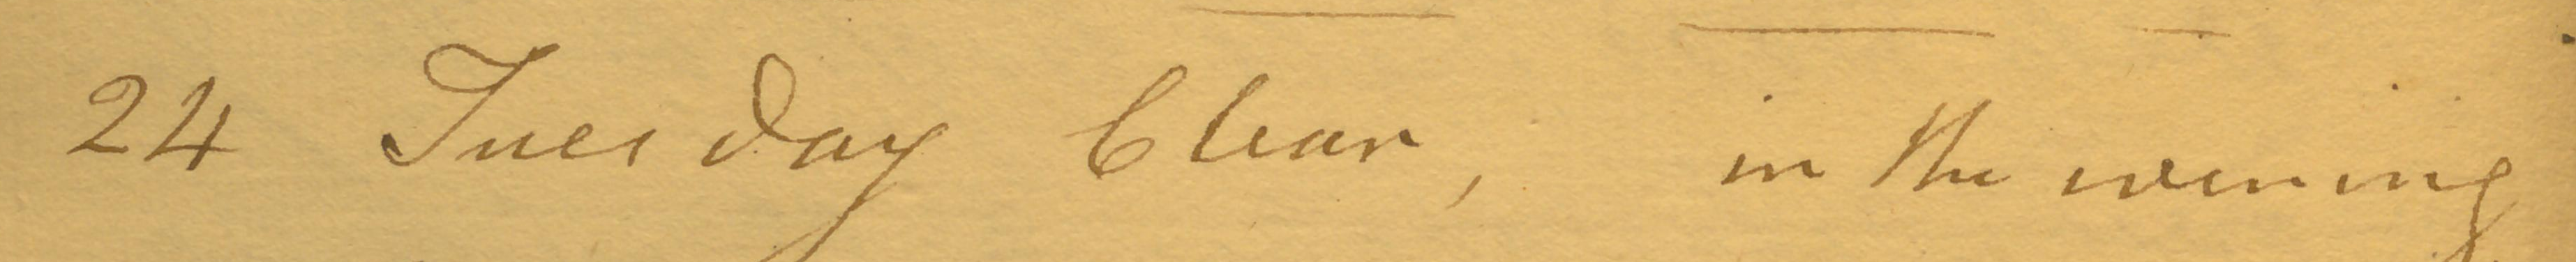24 Tuesday Clear in the evening
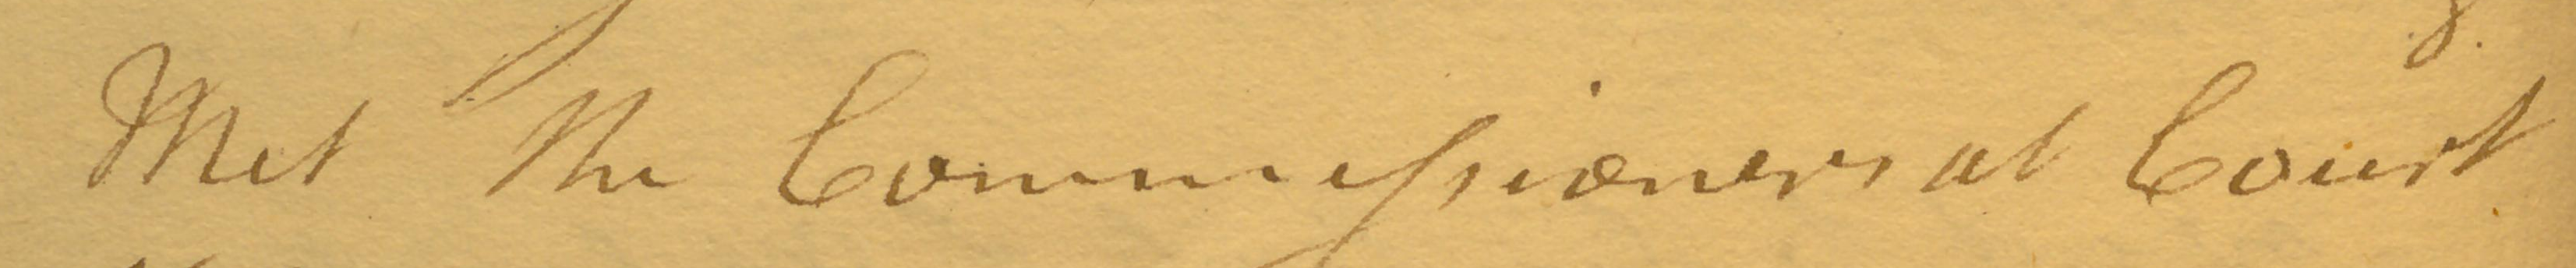Met the Commissioners at Court
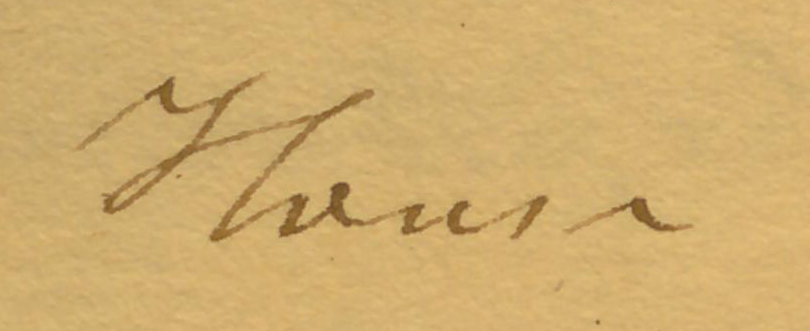House
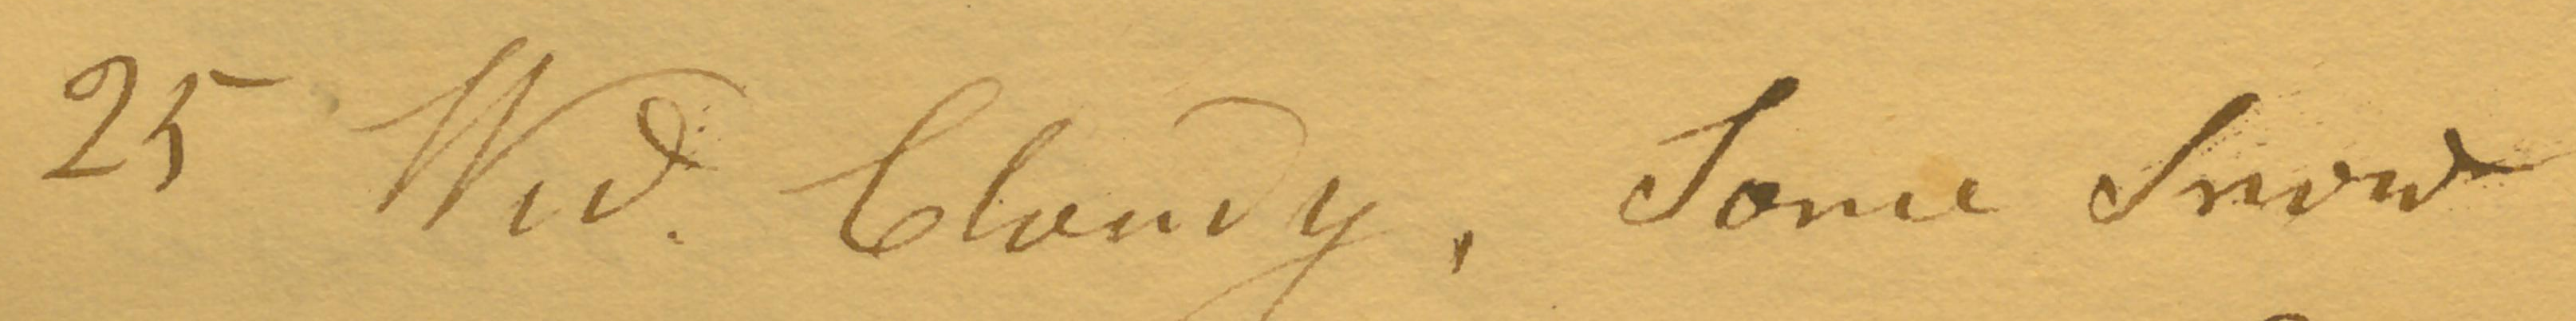25 Wed. Cloudy Some Snow
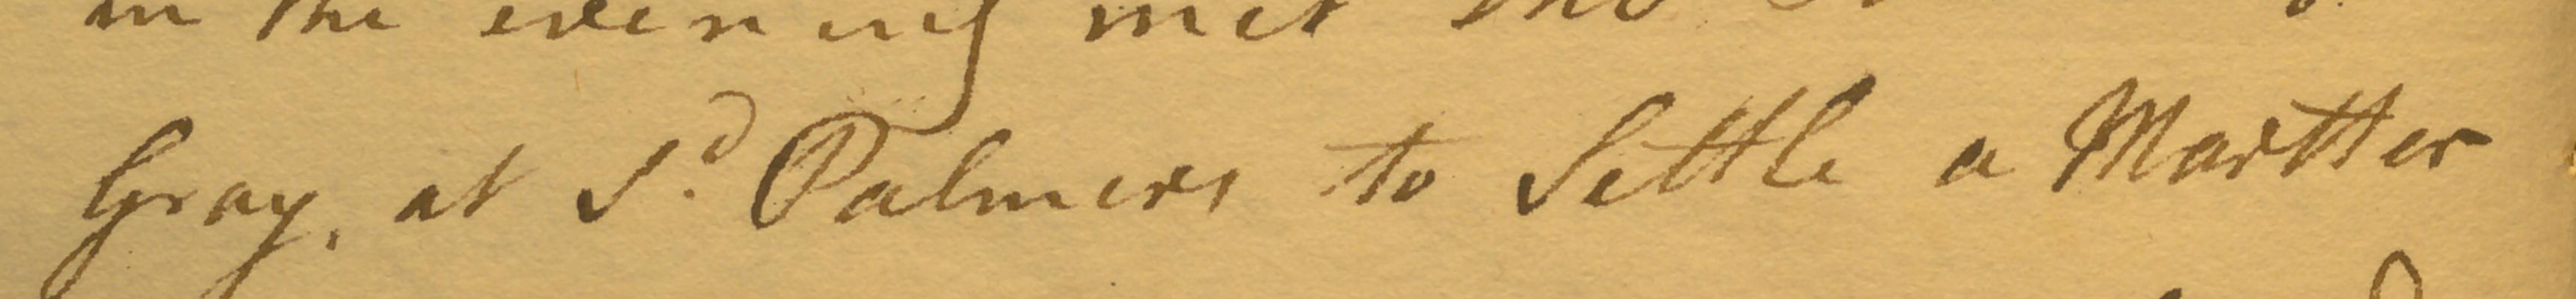Gray at s^d. Palmers to Settle a Martter
